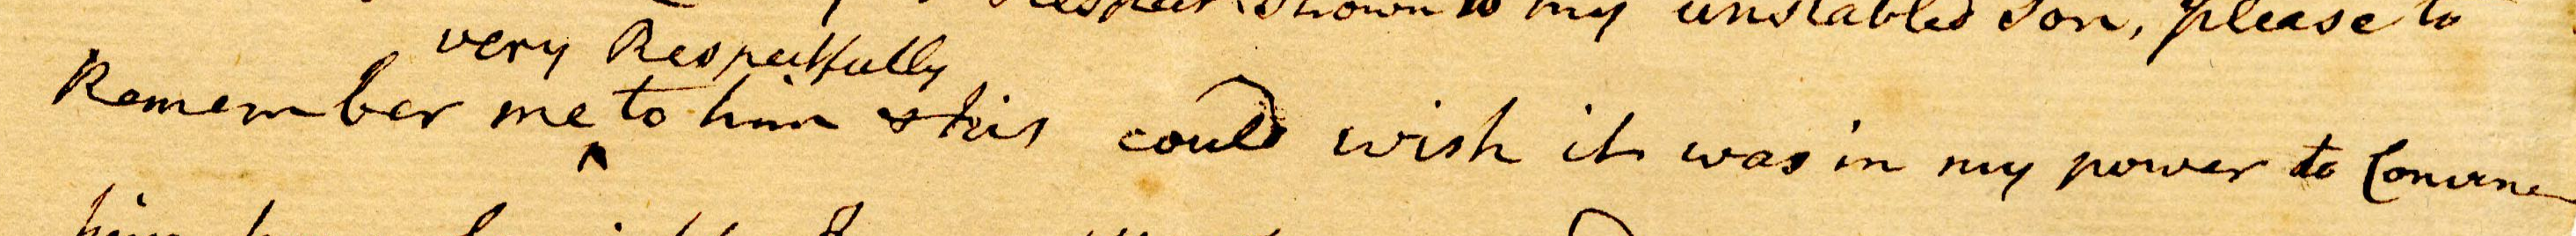Remember me ^ to him & his could wish it was in my power to Convene
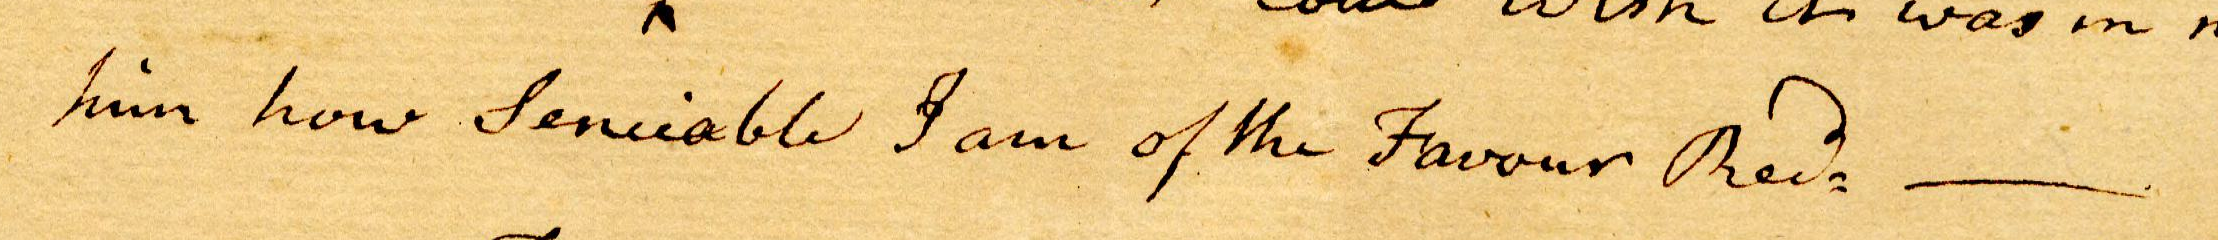him how senciable I am of hte Favour Rec^d:-
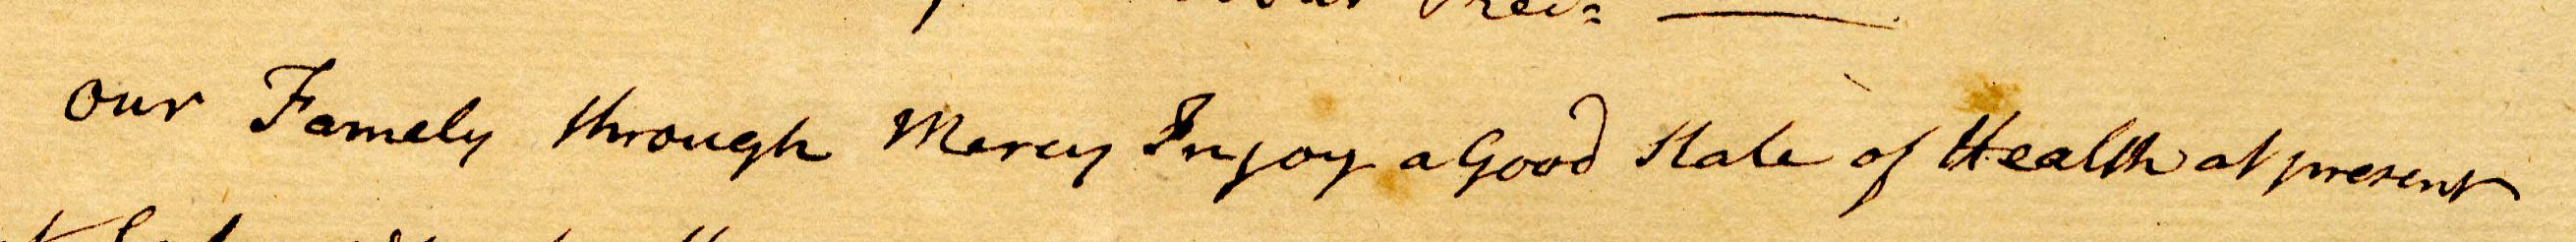Our Family through Mercy Enjoy a Good state of Health at present
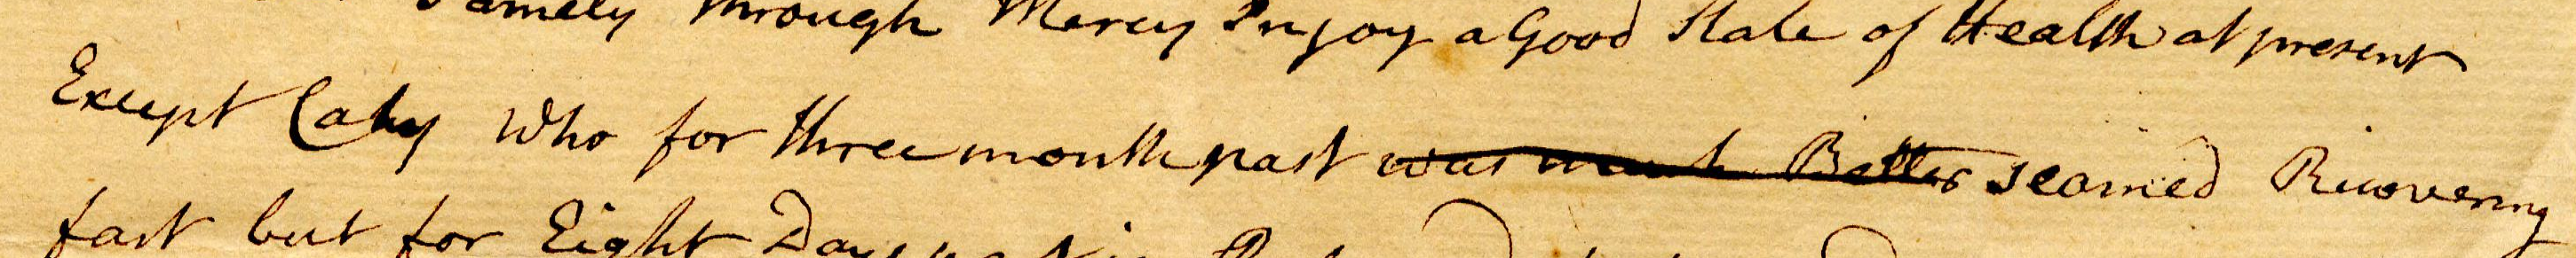Except Caty who for three months past [was went Better] seamed Ricoverry
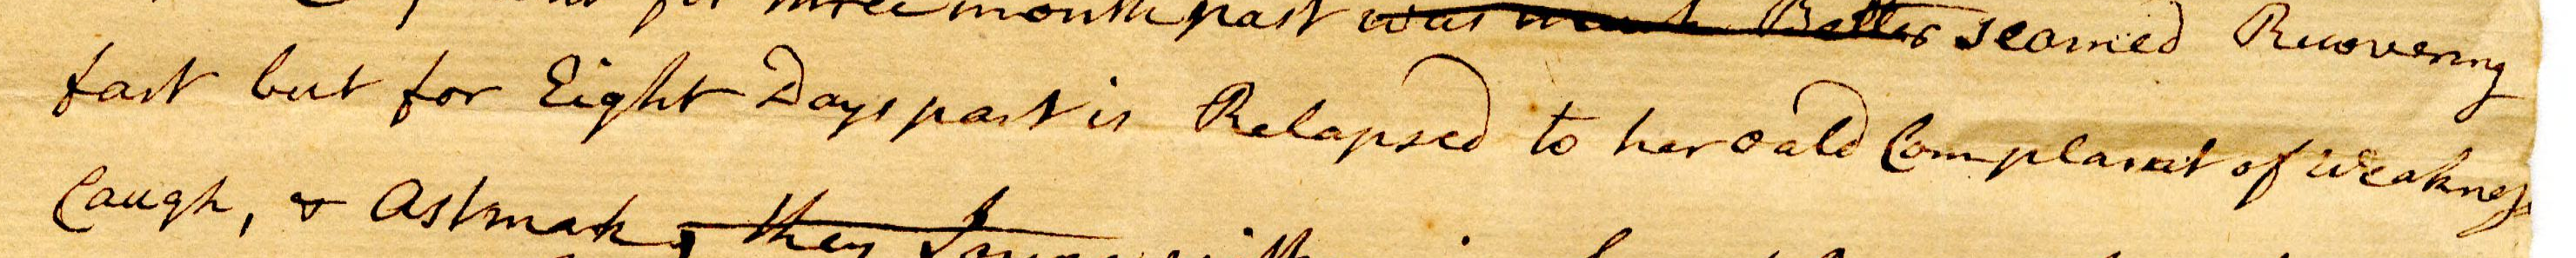fast but for Eight days past is Relapsed to her oald Complaint of Weakness
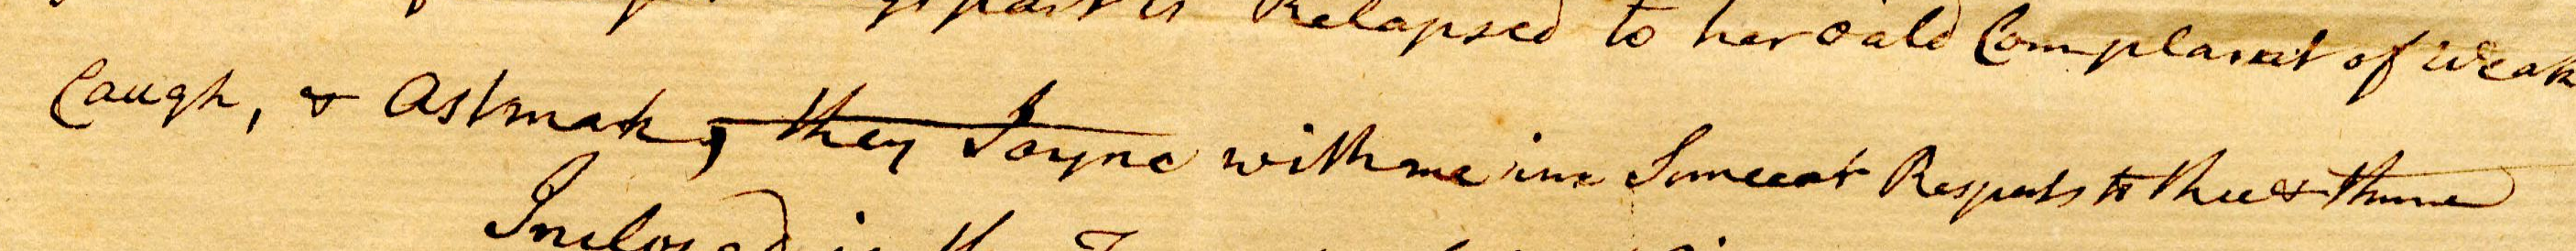Cough, & Astmak, then Joyne with me in sincerst Respects to thee & thine
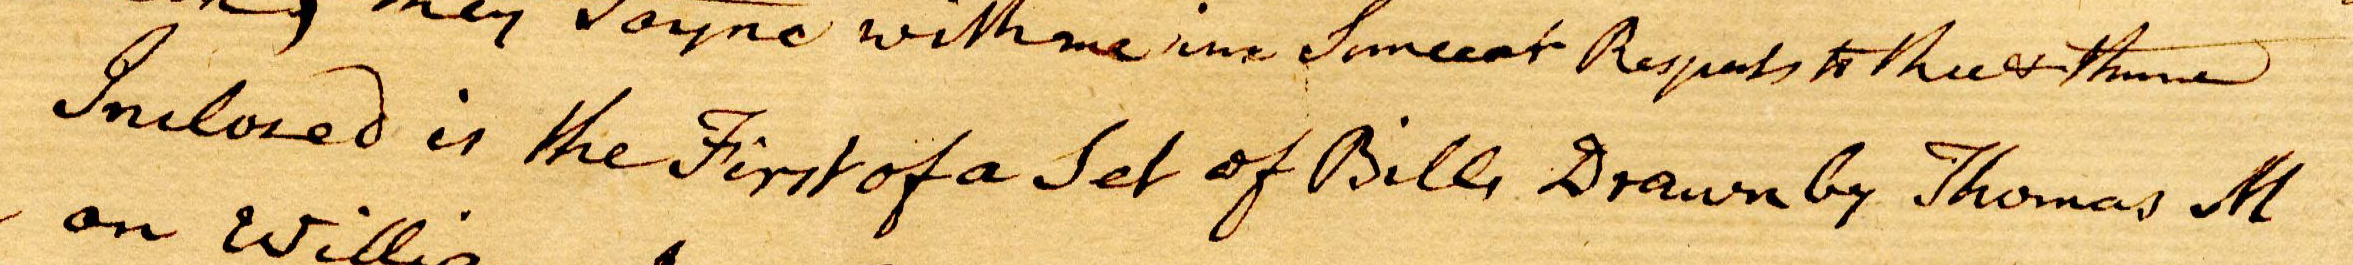Inclosed is the First of a set of Bills Drawn by Thomas M
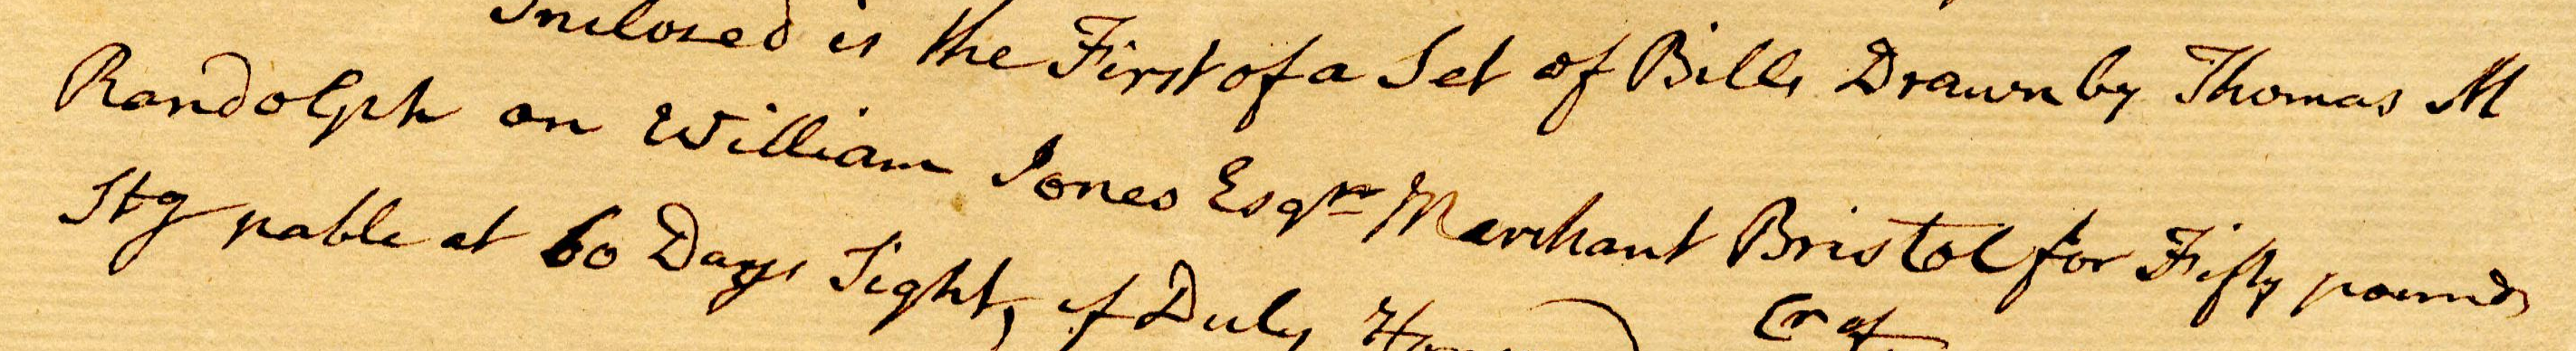Randolph on William Jones Esq^r Merchant Bristol for Fifty pounds
